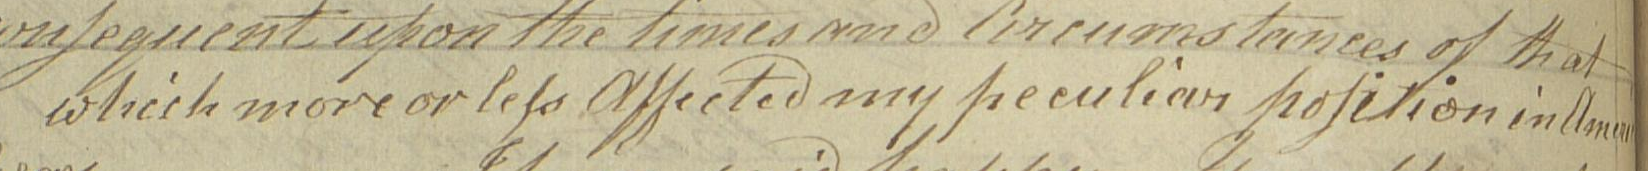which more or less Affected my peculiar position in Amer-
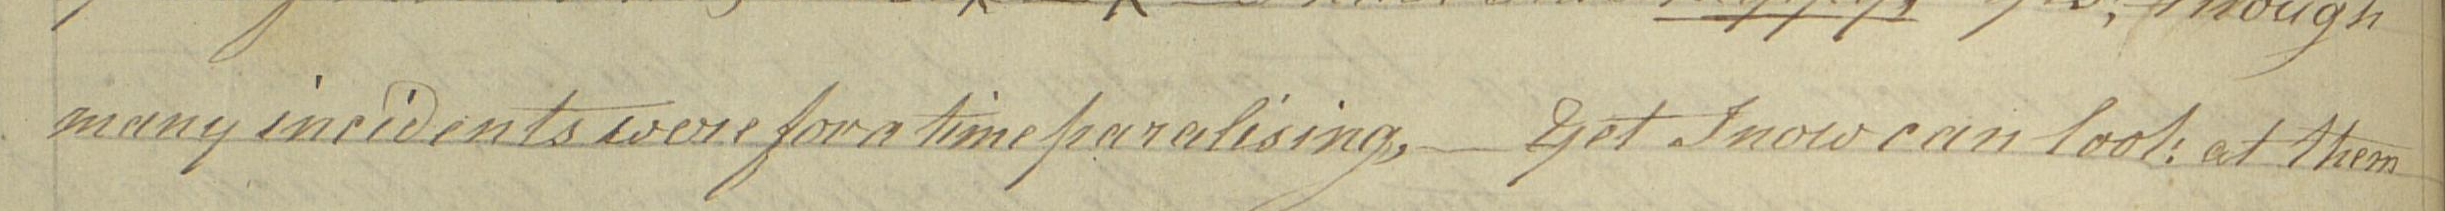many incidents were for a time paralising, Yet Snow can look at them
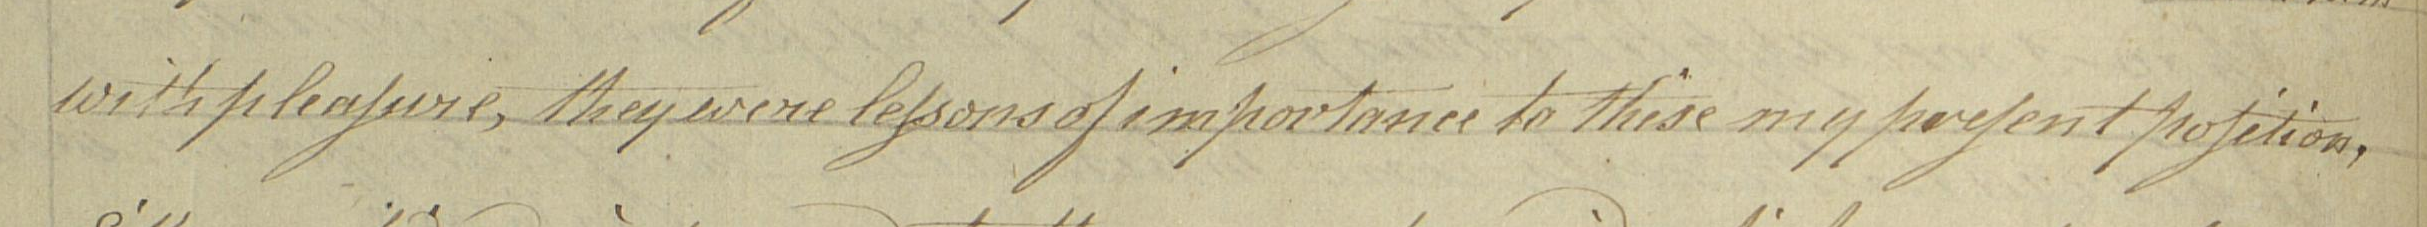with pleasure, they were lessons of importance to thise my present position,
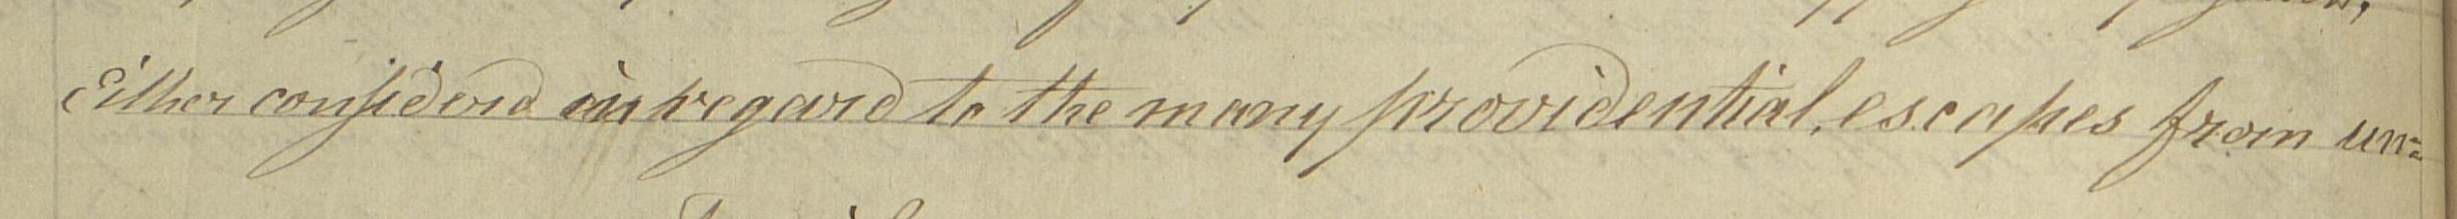either considued in regard to the many providential escapes from un-
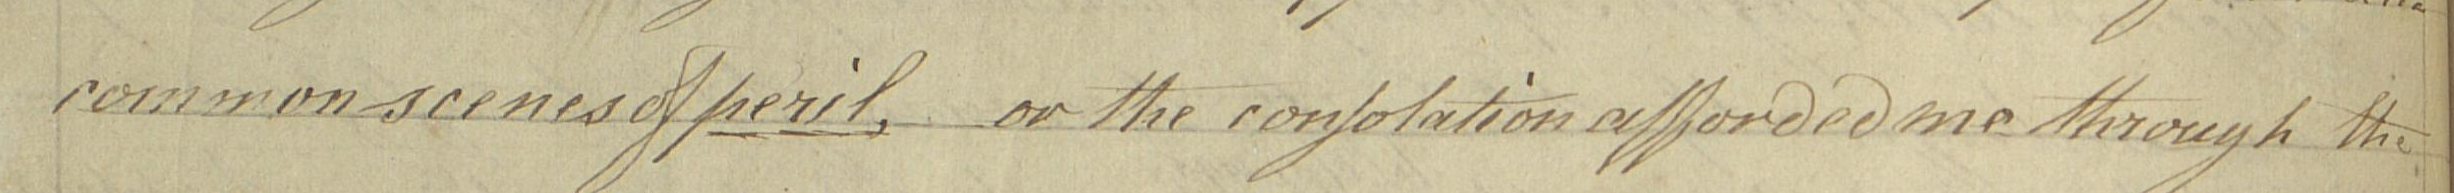common scenes of peril, or the consolation afforded me through the
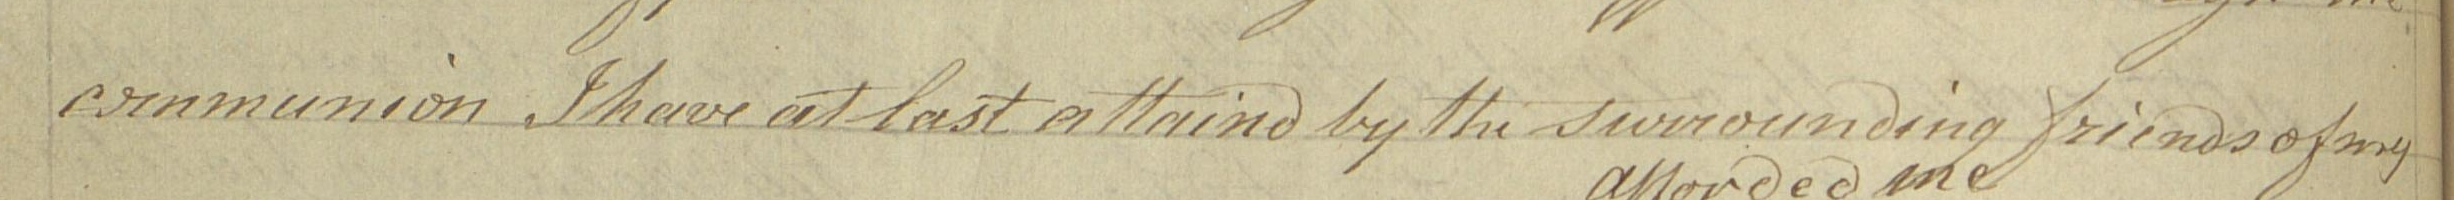communion I have at last attaind by the surrounding friends of my
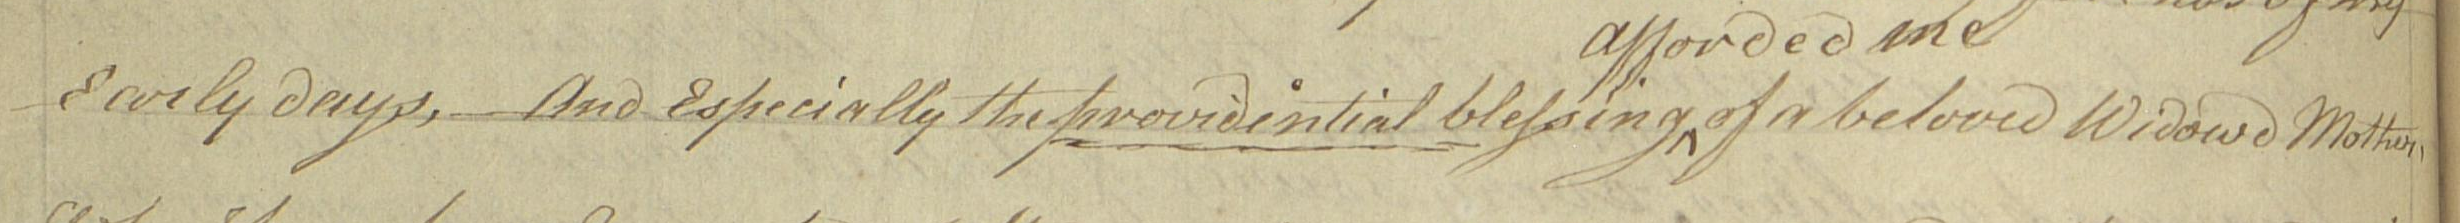Early days, And Especially the providential blessing ^ of a beloved Widow Mother
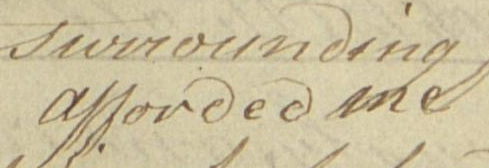afforded me
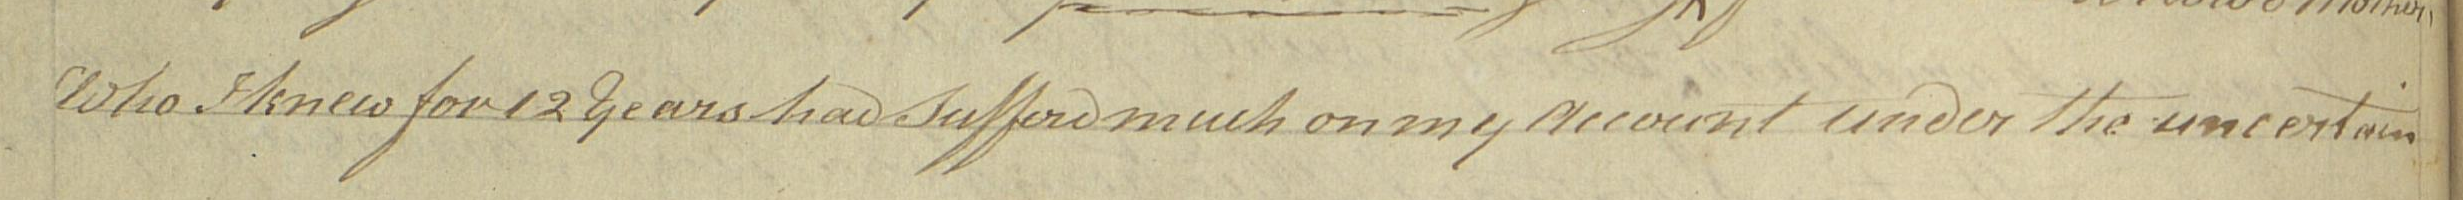who I knew for 12 Years had Sufferd much on my Account under the uncertain
